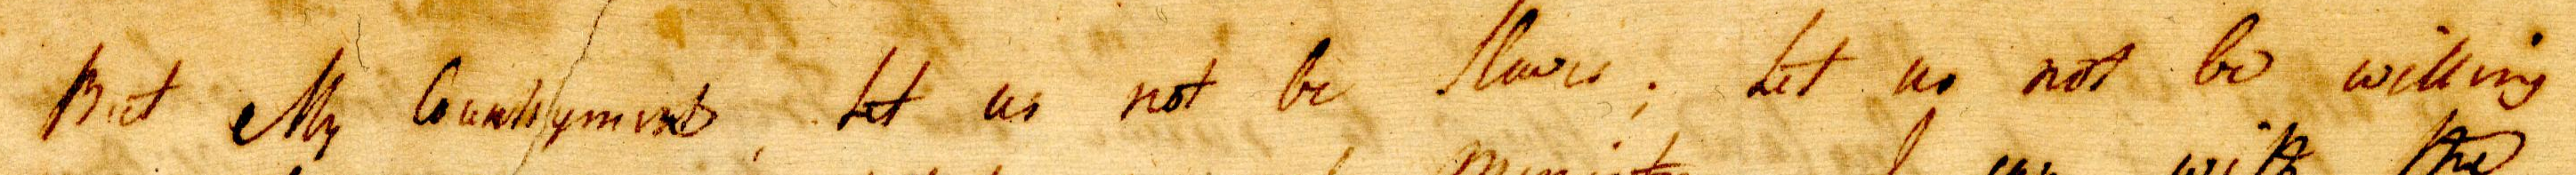But My Countrymen, Let us not be Slaves. Let us not be willing
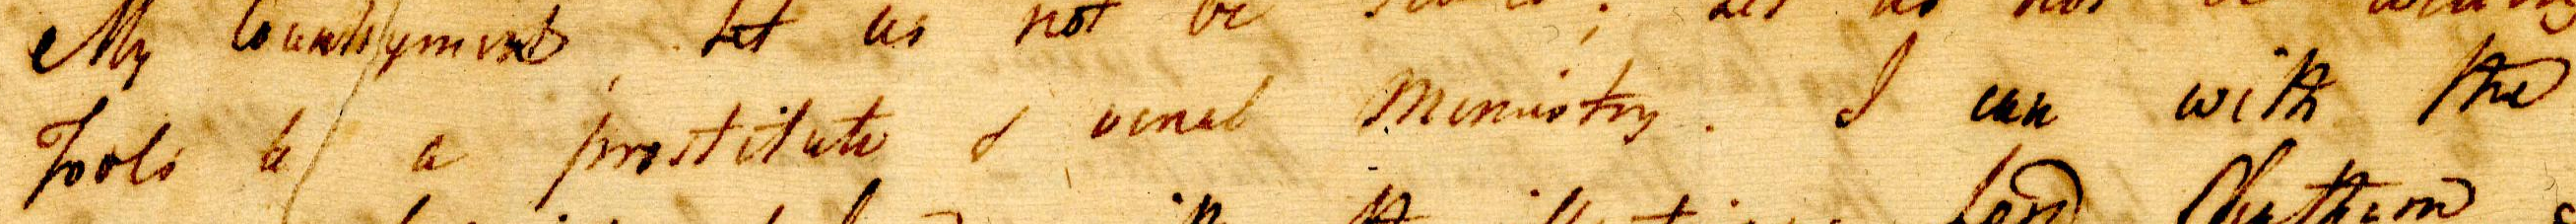Fools to a prostitute & venal Ministry. I can with the
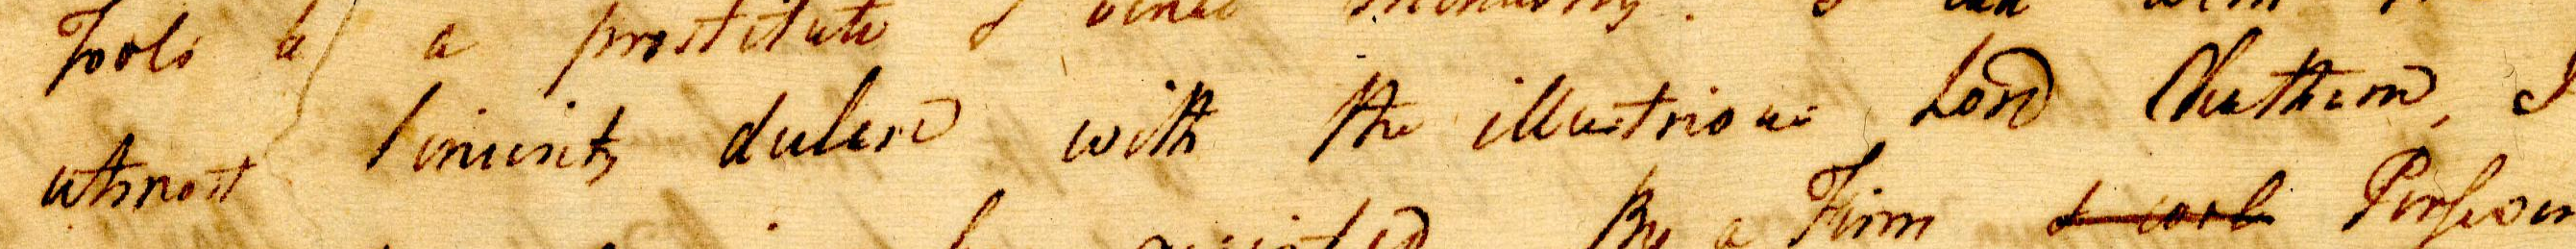utmost Sincerity declare with the illustrious Lord Chatham, I
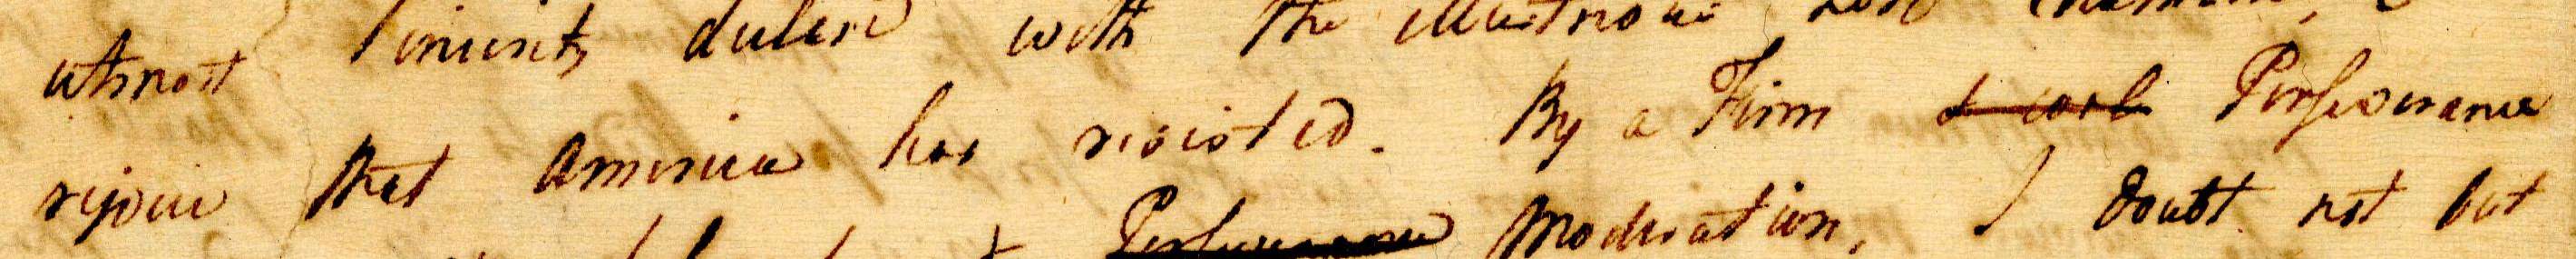rejoice that America has visited. By a firm & cool Perseverance
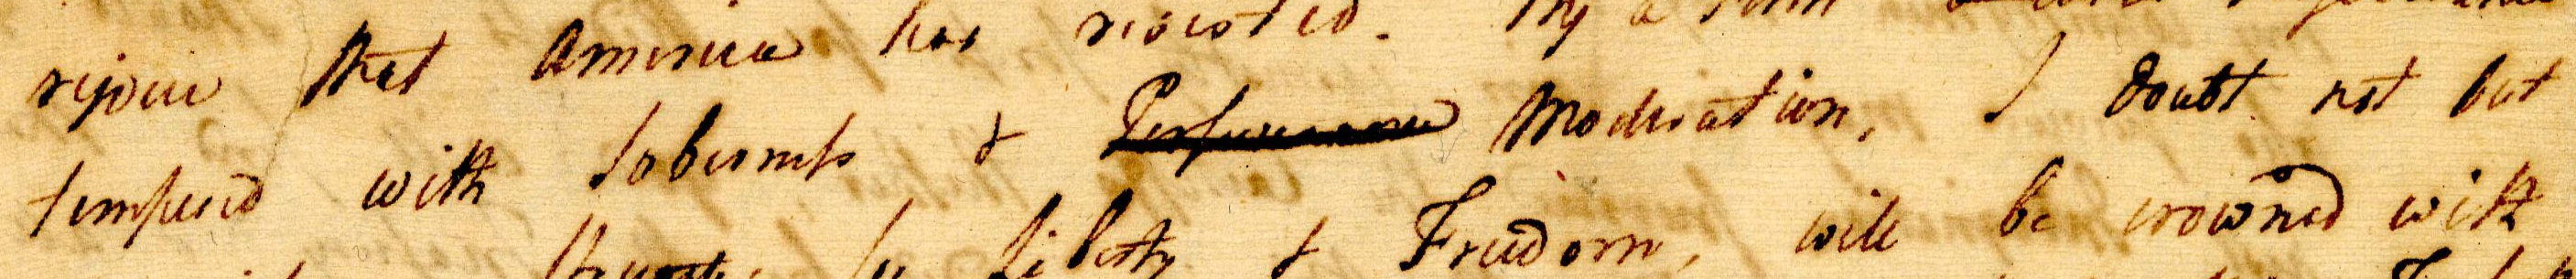tempered with Soberness & Perseverance Moderation. I doubt not but
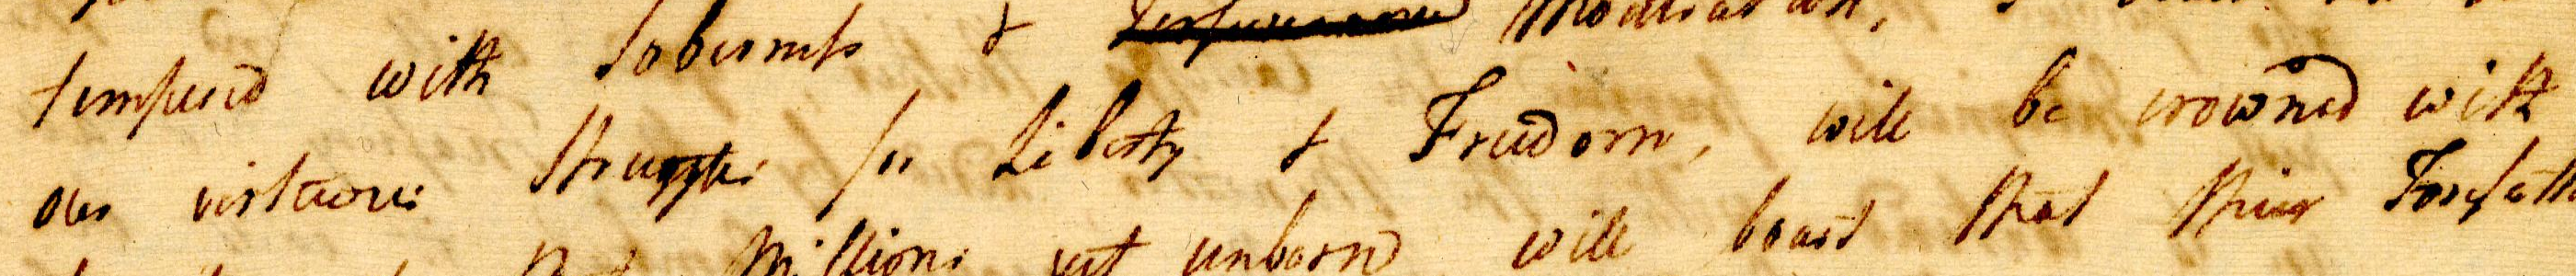our virtuous Struggle for Liberty & Freedom will be crowned with
